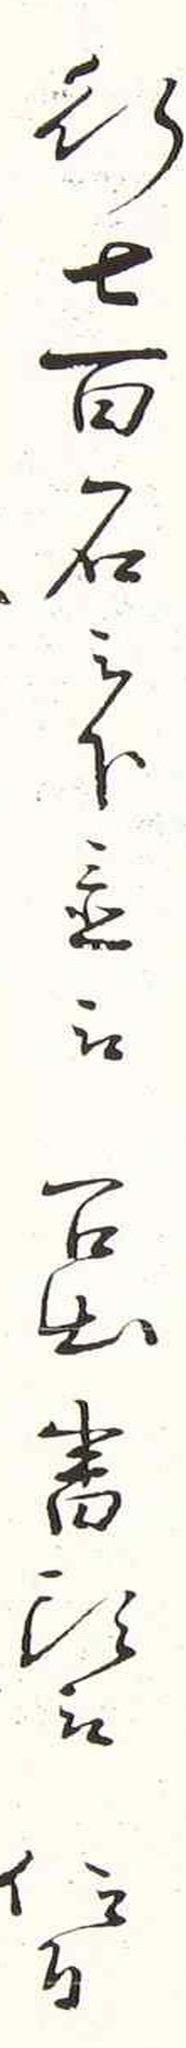行七百石被下置被召出番頭被仰付
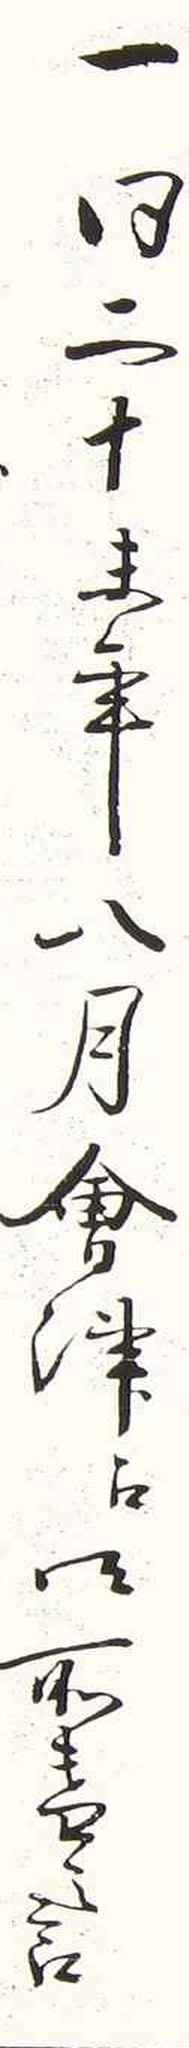一同二十未年八月会津江御所替之節
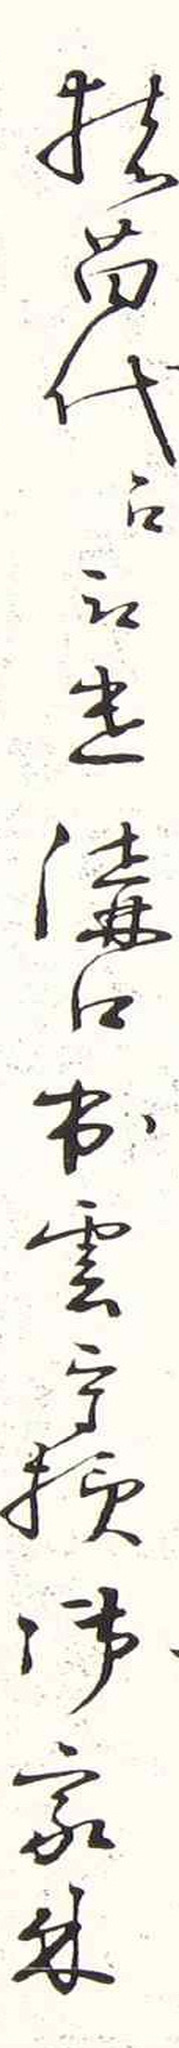猪苗代江被遣溝口出雲守様御家来
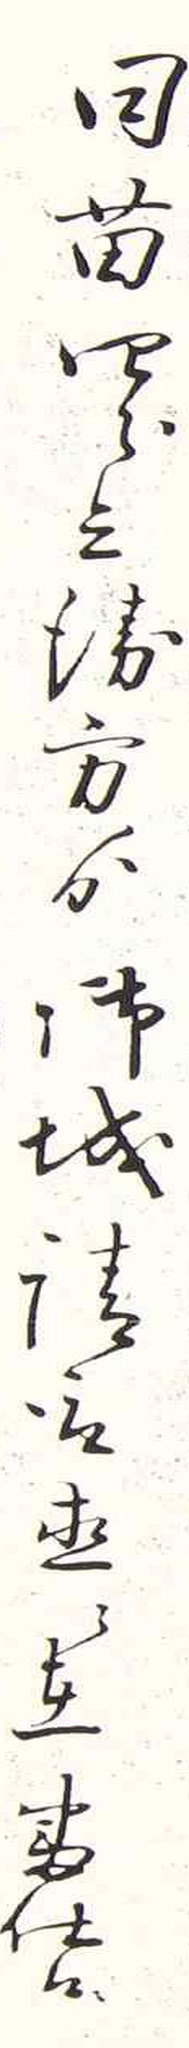同苗四郎兵衛方ゟ御城請取直ニ在番仕候
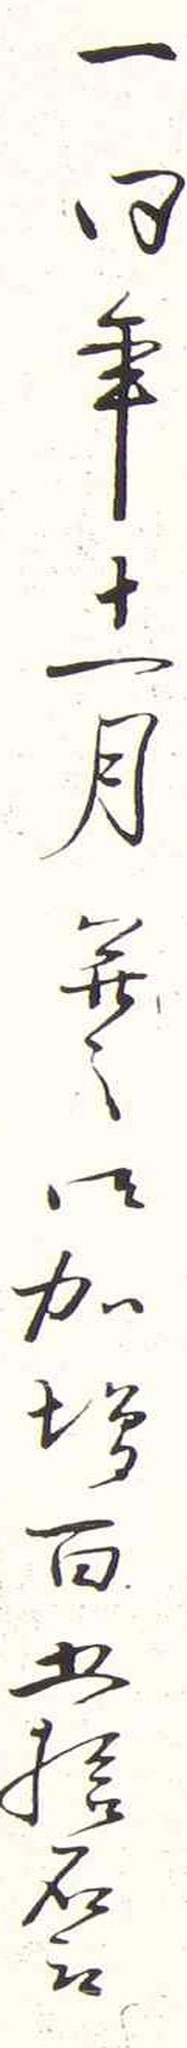一同年十一月並之御加増百五拾石被

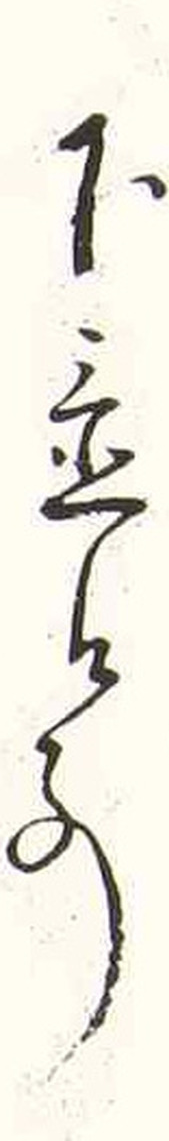下置候事
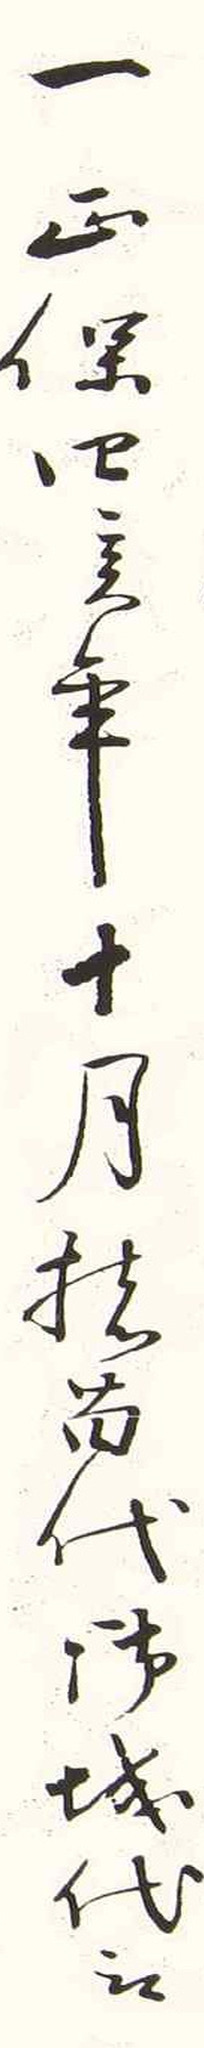一正保四亥年十月猪苗代御城代被
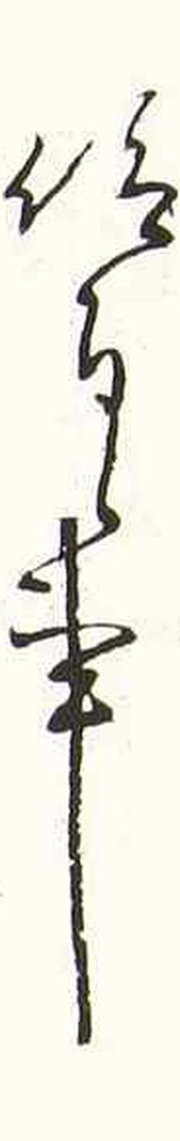仰付候事
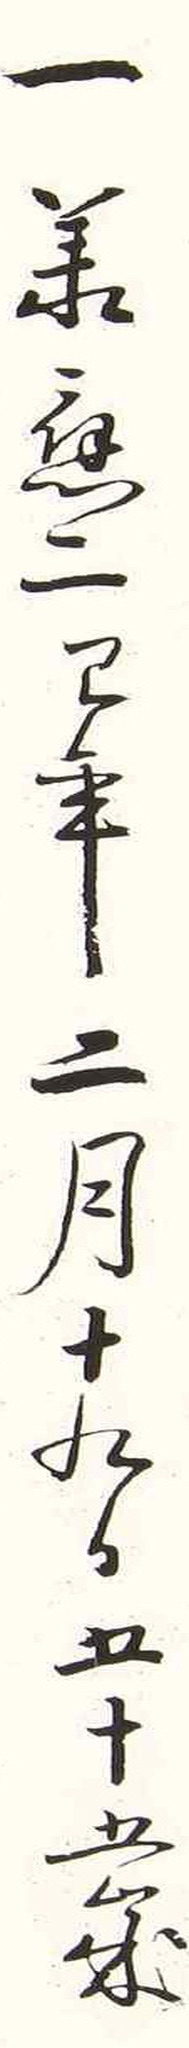一承応二巳年二月十九日五十五歳
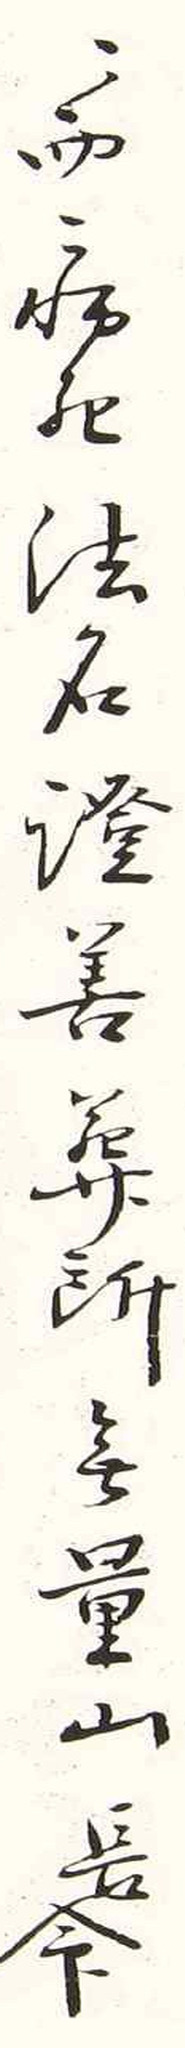ニ而病死法名証善葬所無量山長命
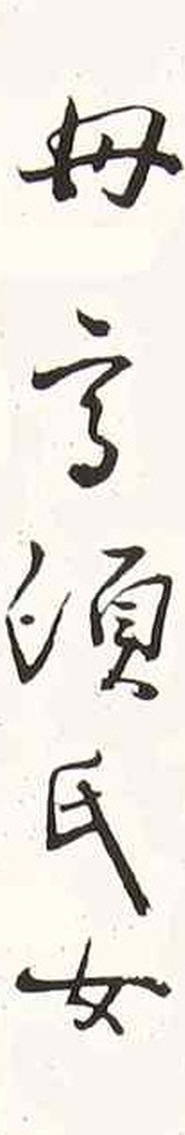母高須氏女
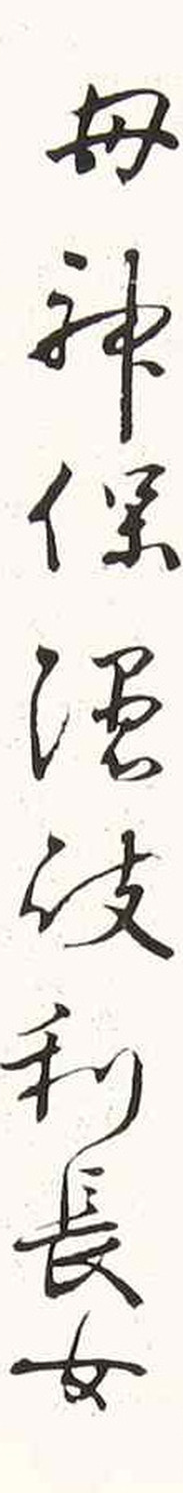母神保隠岐利長女
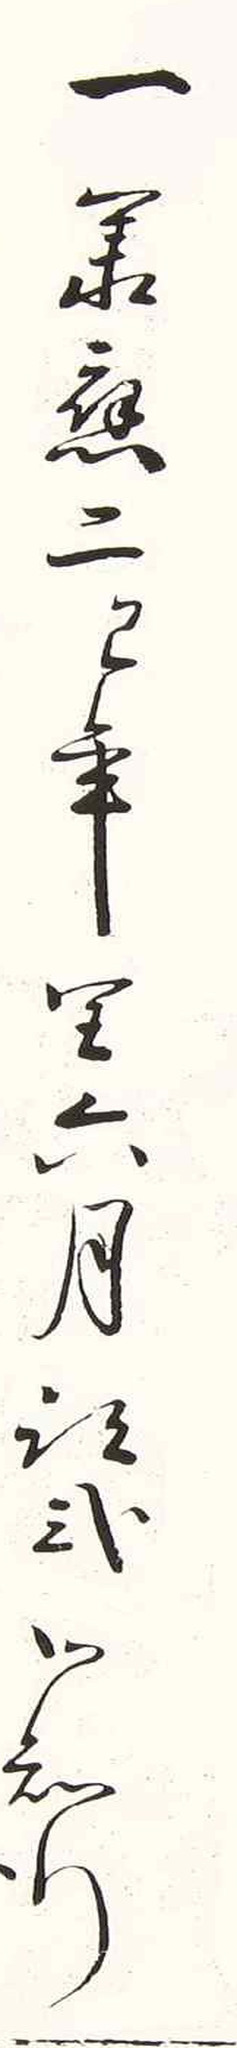一承応二巳年閏六月跡式御知行
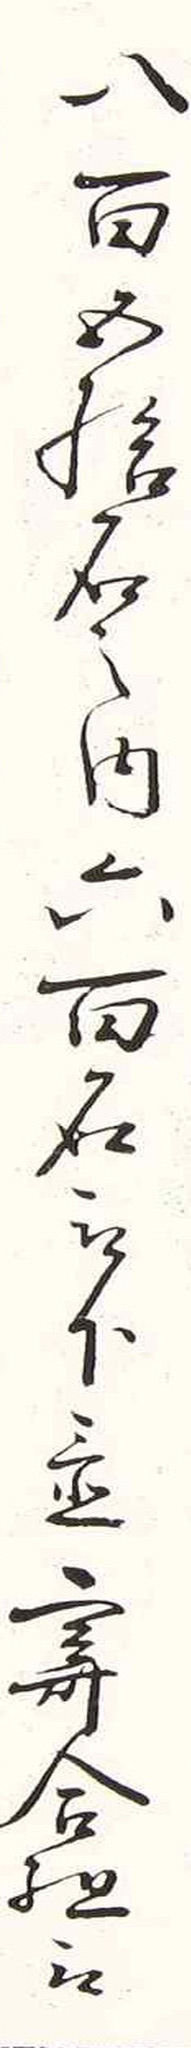八百五拾石之内六百石被下置寄合組被
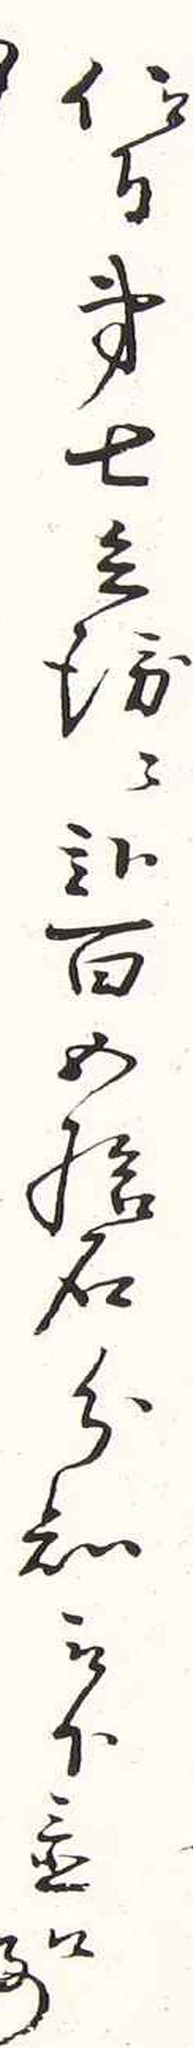仰付弟七兵衛ニ弐百五拾石分知被下置候事
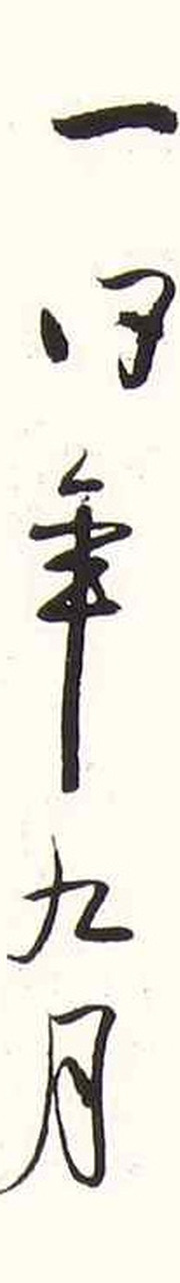一同年九月
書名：諸士系譜　巻之357　す之部7
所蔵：会津若松市立会津図書館
